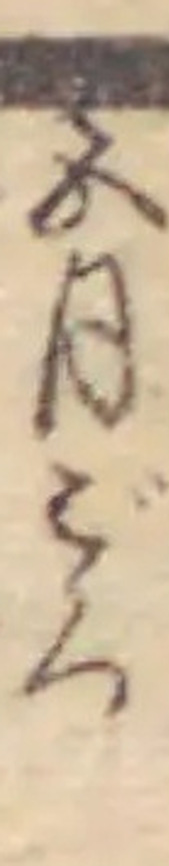五月ごろ
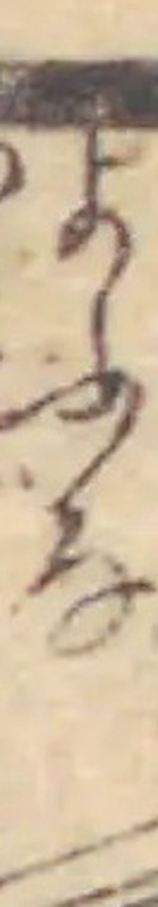よふな
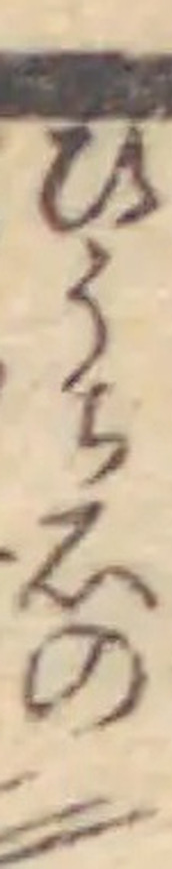ひうち石の
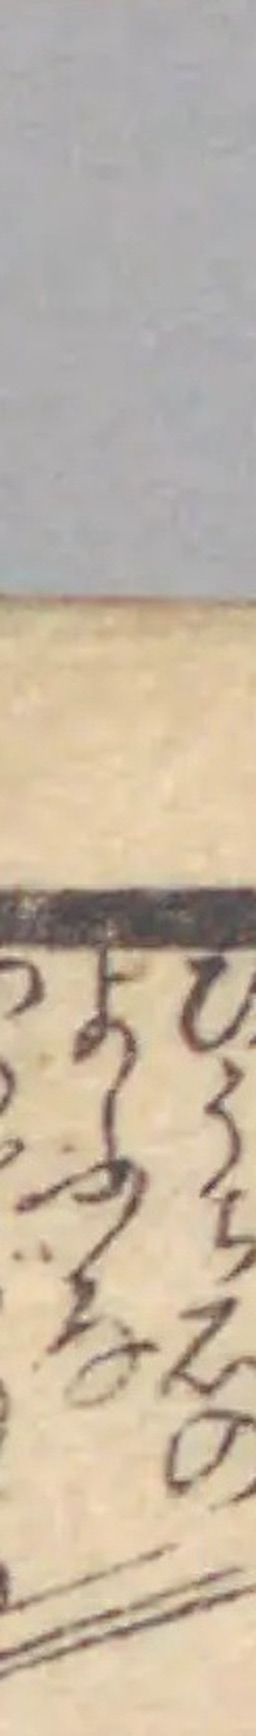よふな
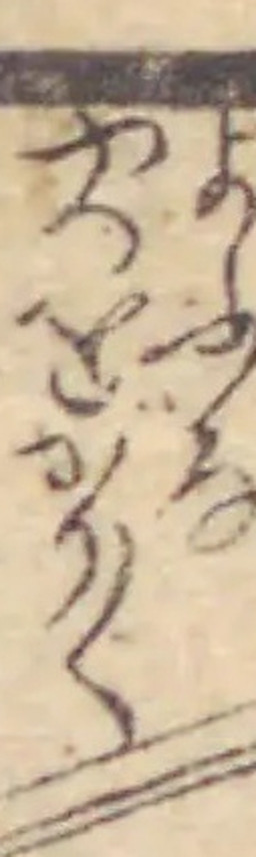やつをがり〳〵
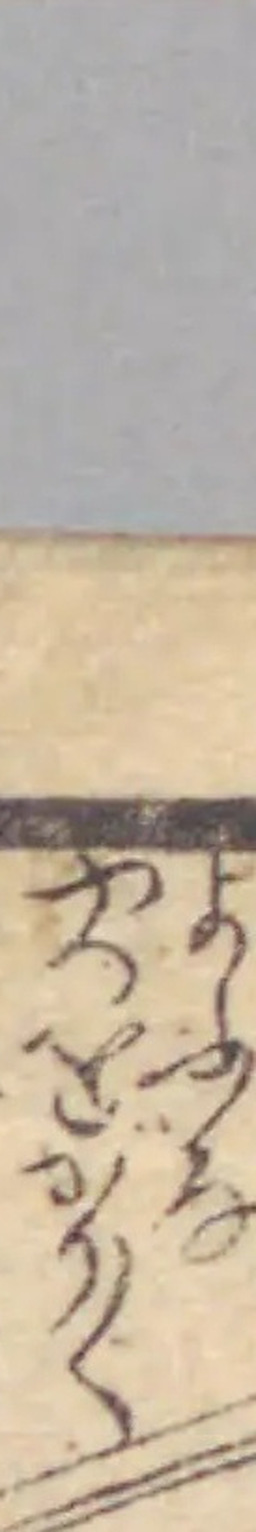やつをがり〳〵
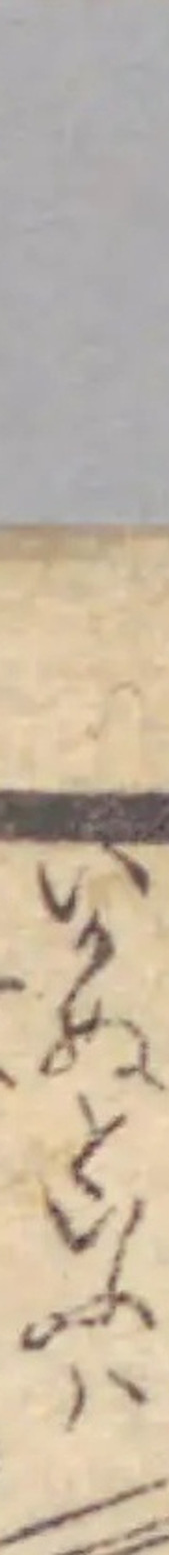いかぬといふは
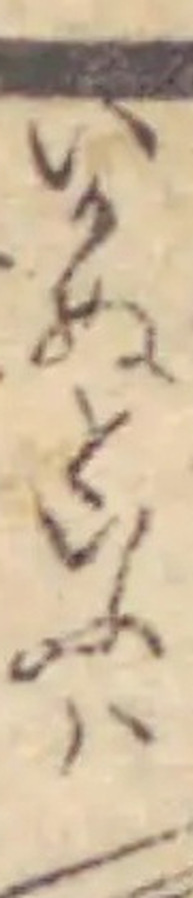いかぬといふは
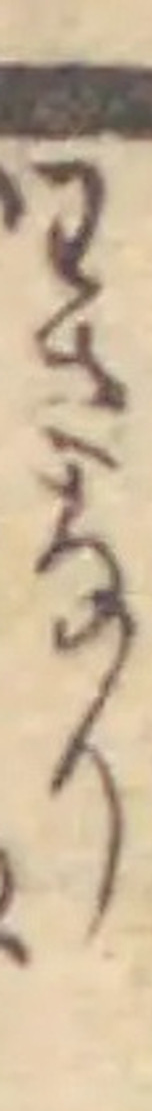わさなり
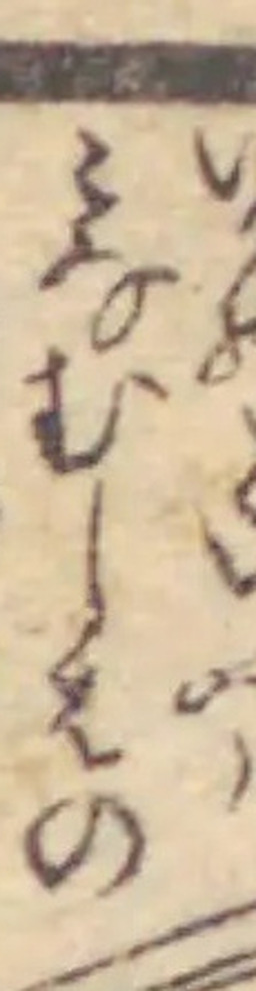みなむしはの
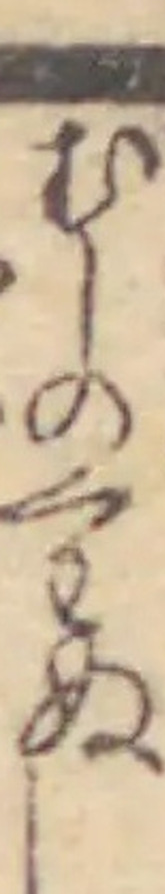むしのくわぬ
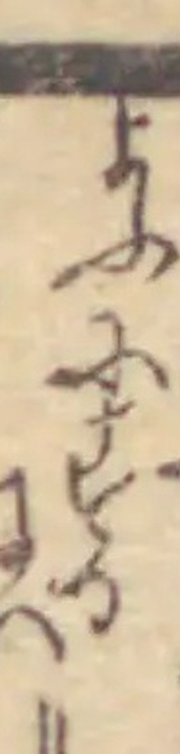よふにする
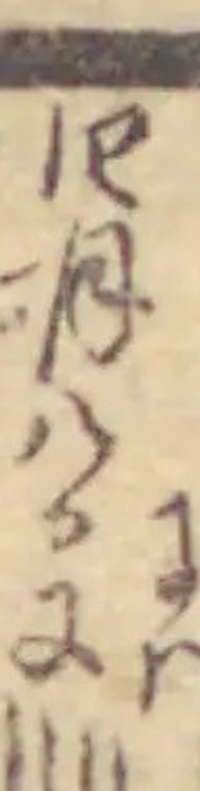四月八日に
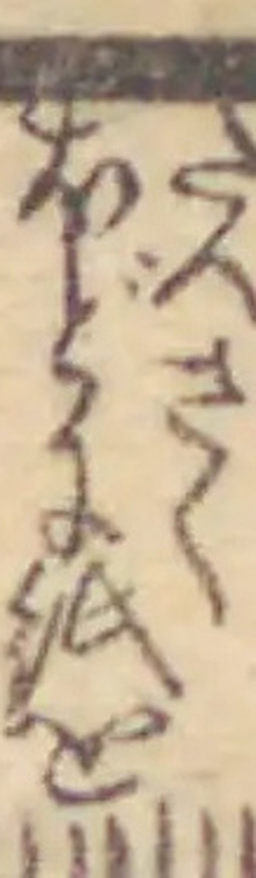ほどに紙を
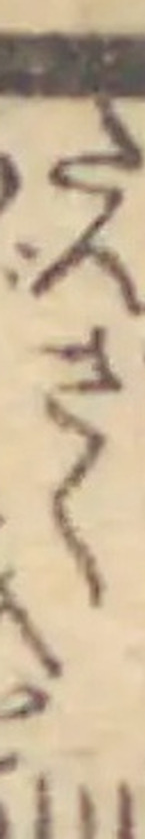たんざく
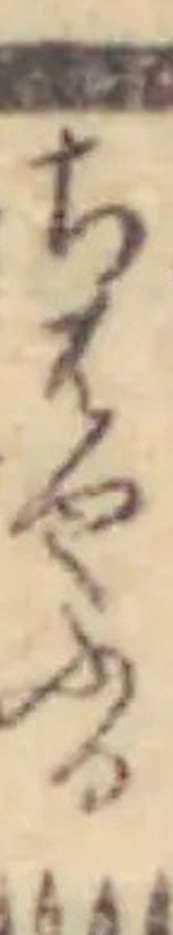ちはやふる
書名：家伝寿命薬 2巻
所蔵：国立国会図書館 National Diet Library, JAPAN
